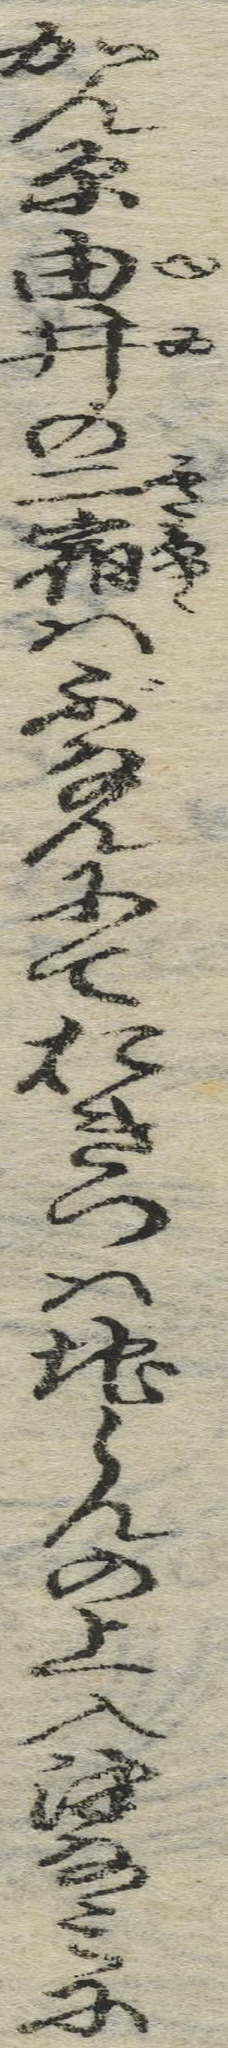かん原由井の二宿はぶなんにておきつは地しんの上入津なみに
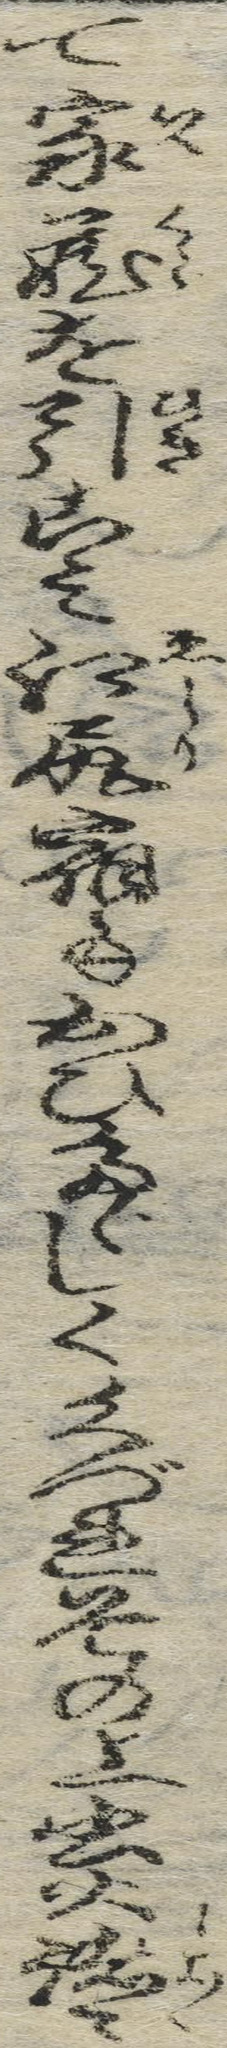て家蔵を引こみ江尻宿もおひたゞしくくづれその上出火諸々
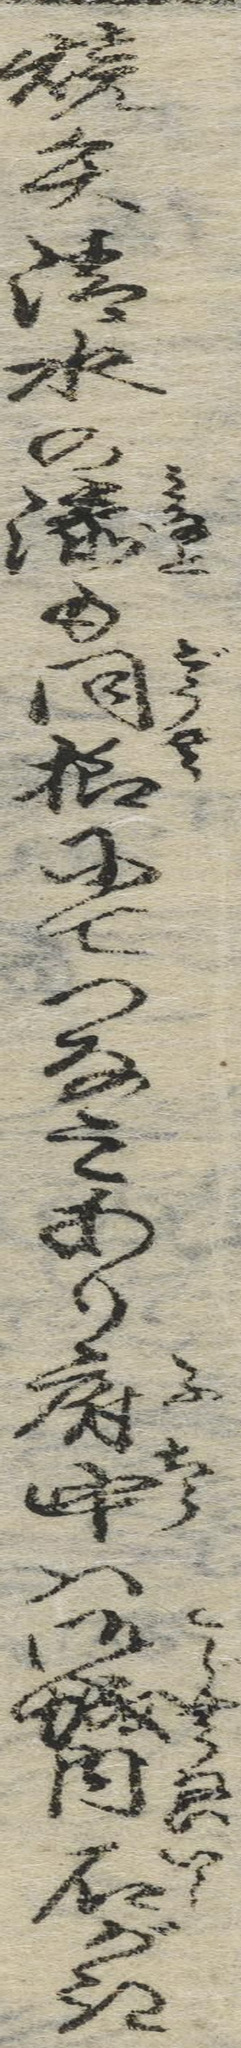焼失清水の湊も同様にてつなみあり府中は御城内石がき
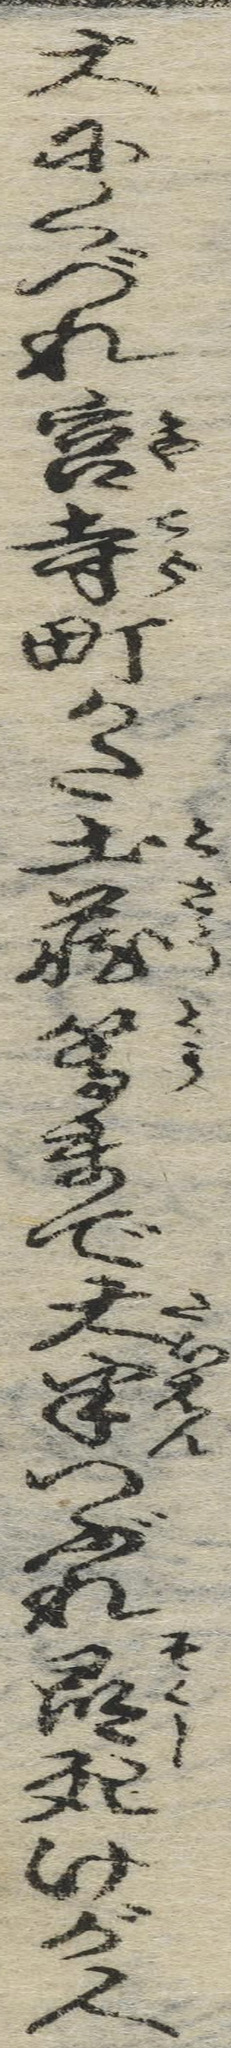大にくづれ宮寺町かた土蔵等まで大半つぶれ即死けが人
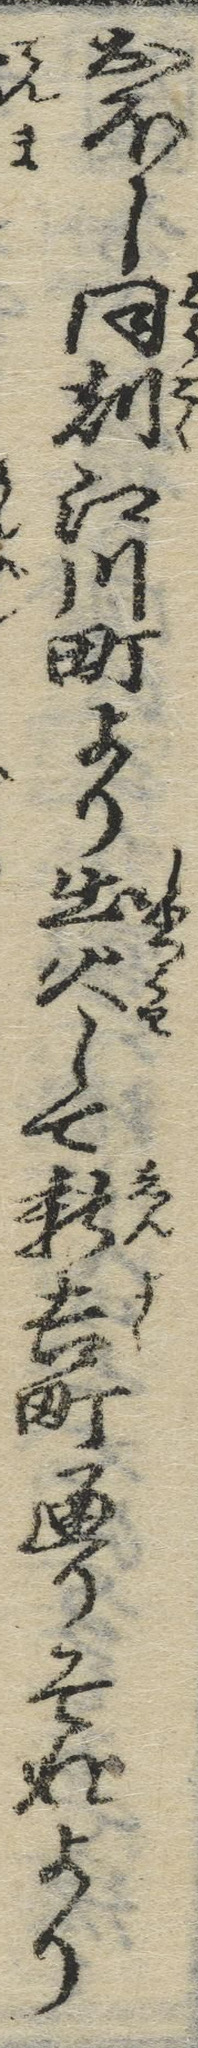おほし同刻江川町より出火して新吉町通りそれより
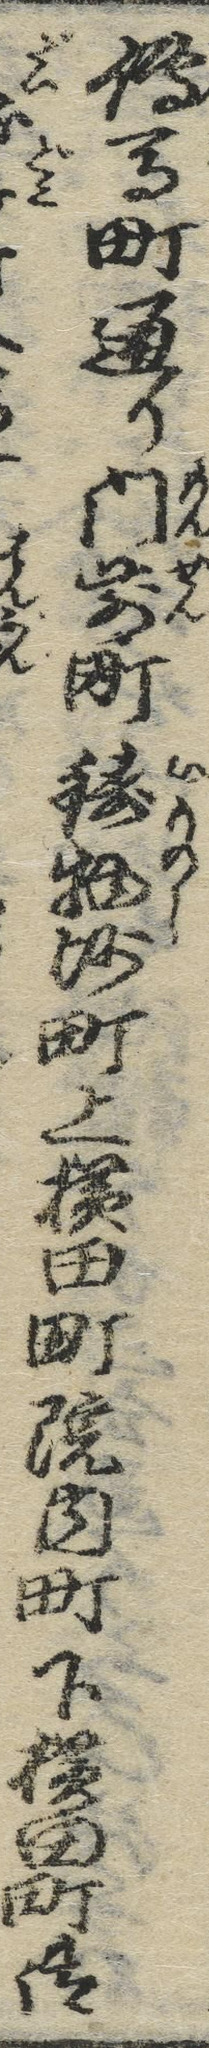伝馬町通り門前町鋳物師町上横田町院内町下横田町御
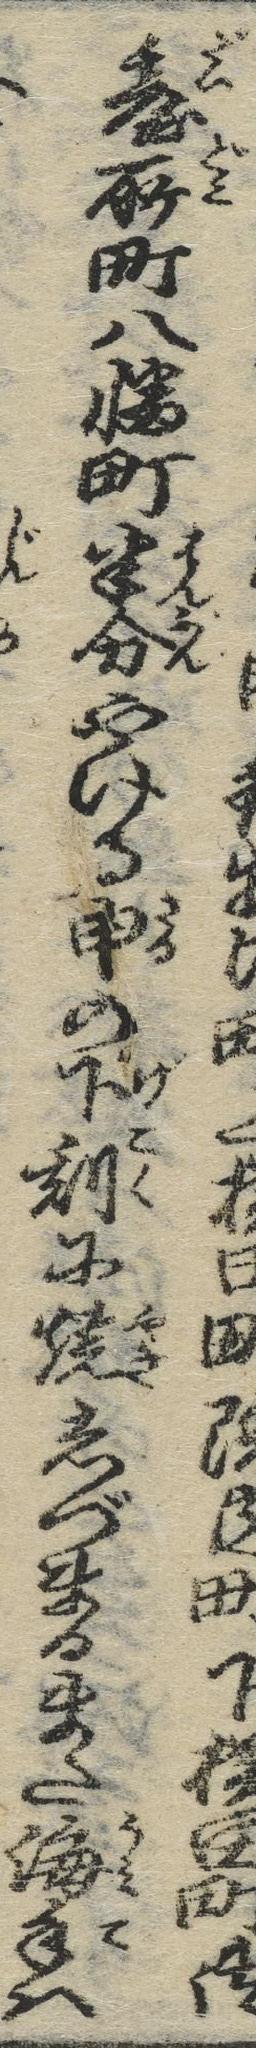台所町八幡町半分やける申の下刻焼しづまるまた海手は
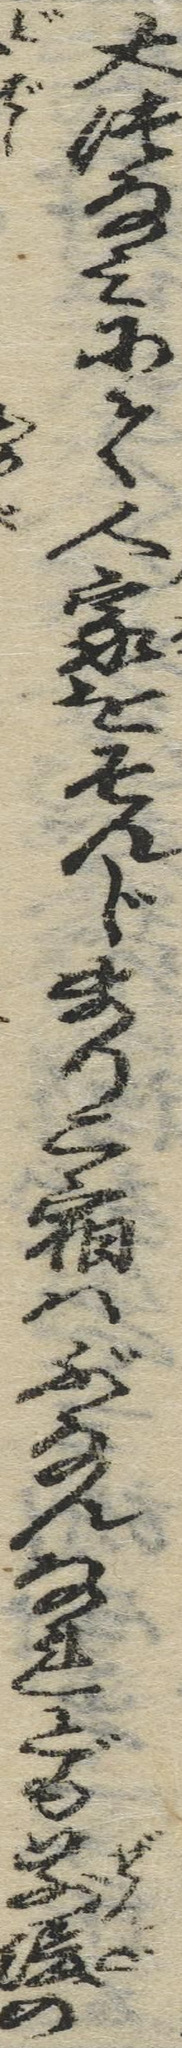大つなみにて人家をそんじまりこ宿はぶなんなれども前後の
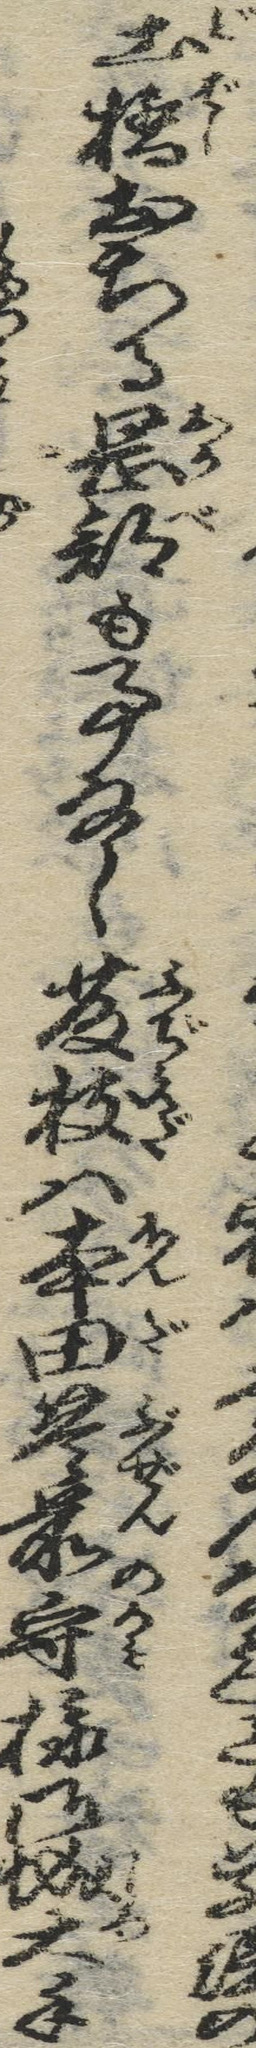土橋おちる岡部も事なし藤枝は本田豊前守様御城大手
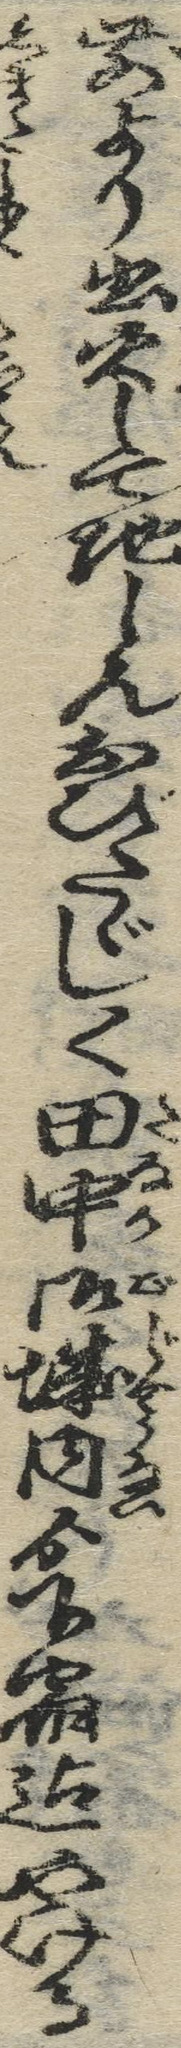前より出火して地しんおびたゞしく田中御城内ゟ下宿迄やける
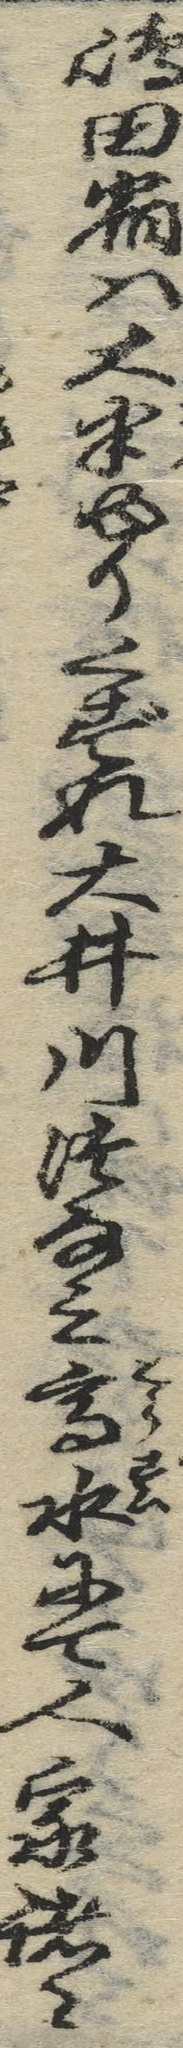嶋田宿は大半ゆりくずれ大井川つなみ高水にて人家諸々
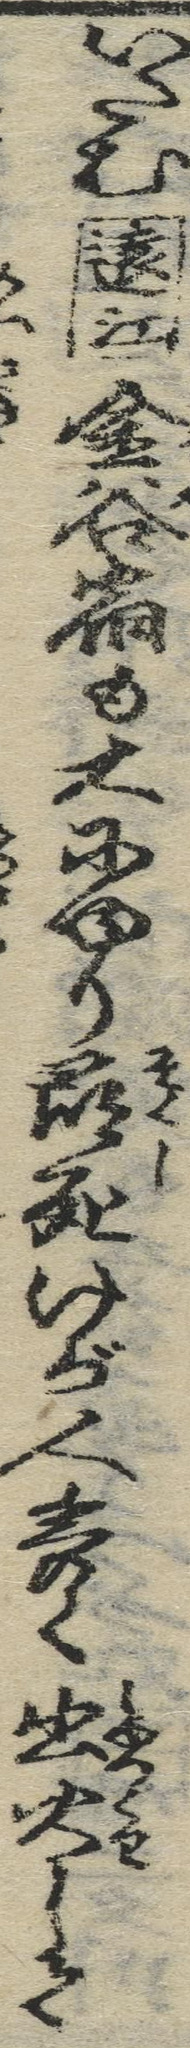いたむ遠江金谷宿も大半ゆり即死けが人多く出火して
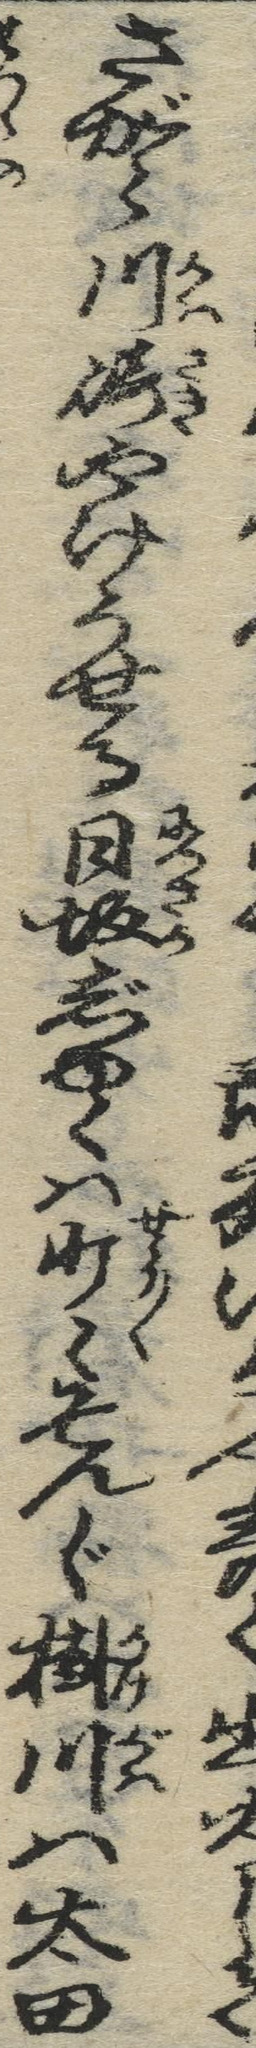さがら川崎やけうせる日坂じゆくは少々そんじ掛川は太田
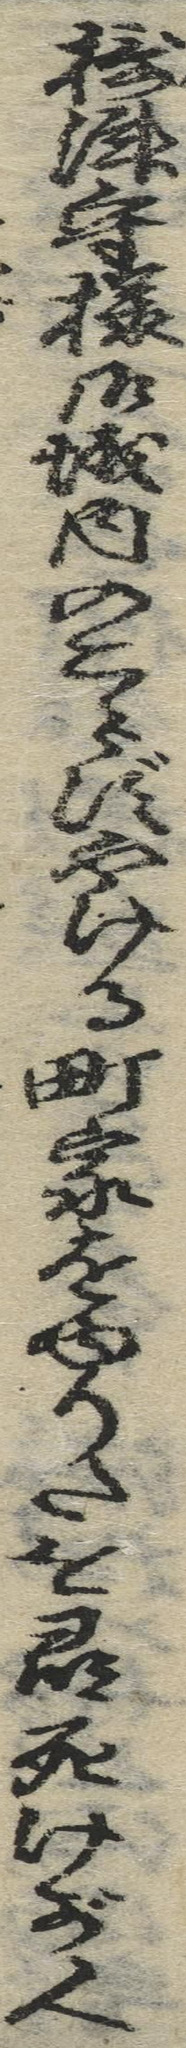摂津守様御城内のこらずやける町家をゆりたを即死けが人
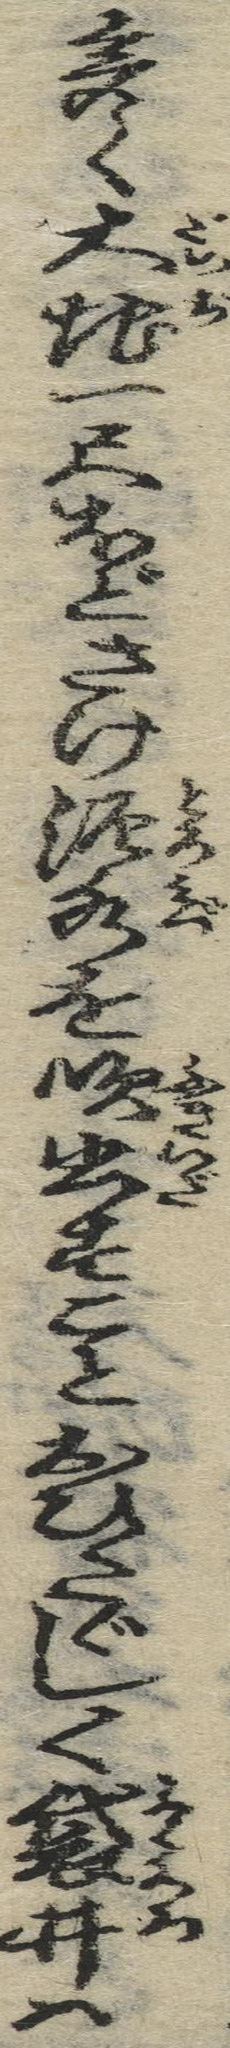多く大地一尺ほどさけ泥水を吹出すことおひたゞしく袋井は

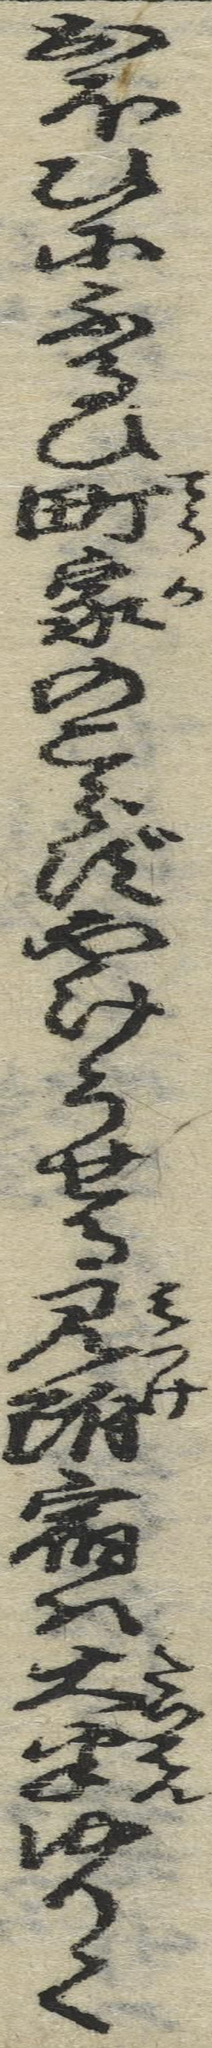おふひにふるひ町家のこらずやけうせる見附宿は大半ゆりく
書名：諸国海辺地震津波書
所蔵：東京大学地震研究所図書室 Earthquake Research Institute Library, The University of Tokyo, JAPAN
